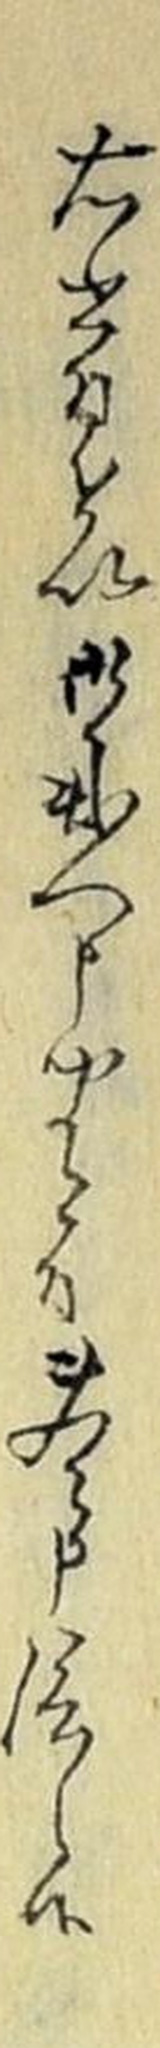右書付を以御用人申聞候に付夫々申渡之候
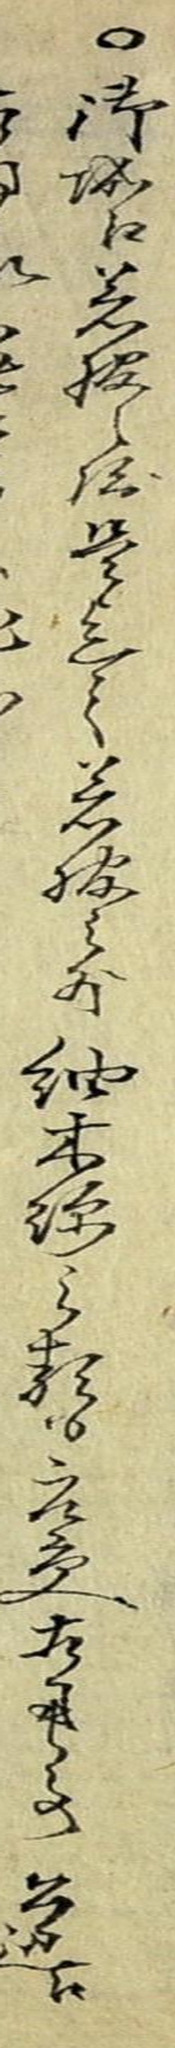○御城江着服之儀是迄之着服之外紬木綿之類も取交相用候事公辺江
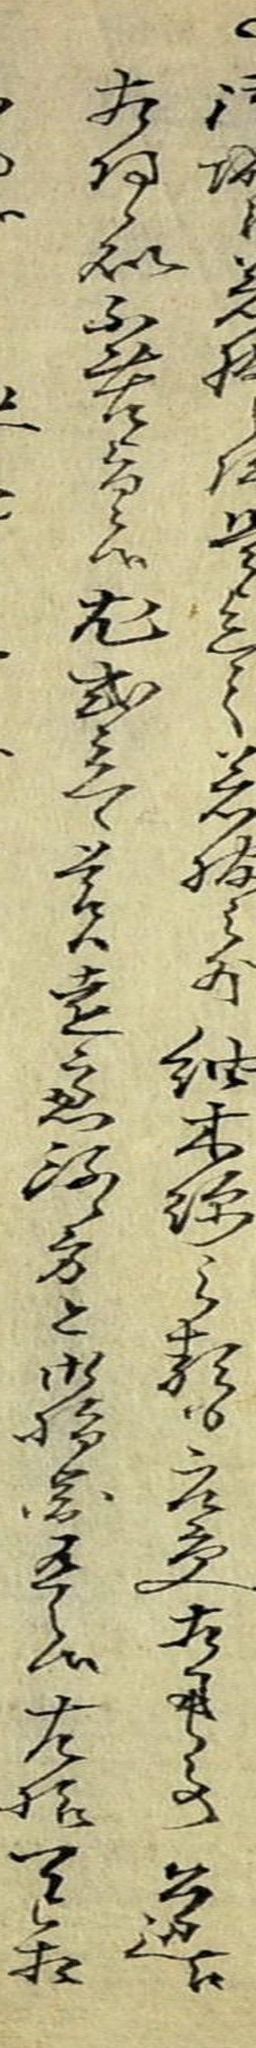相伺候処不苦旨に候尤式立之節は遠慮致候方と御指図有之候左様可被相
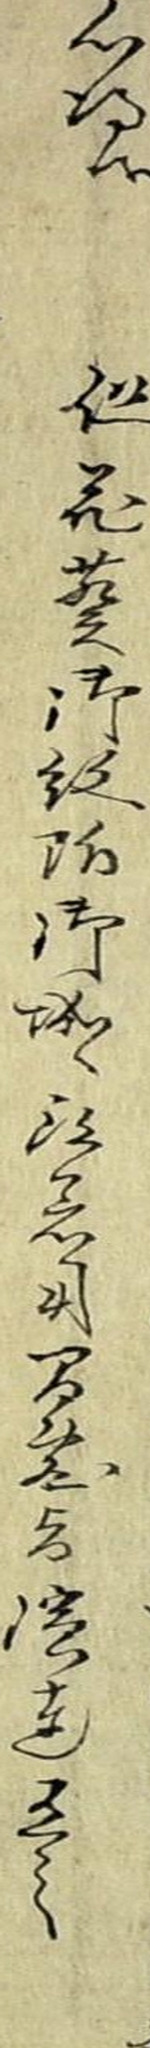心得候但花葵御紋附御城へ致着用間敷旨演達有之
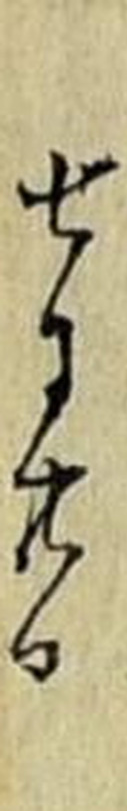七月廿日
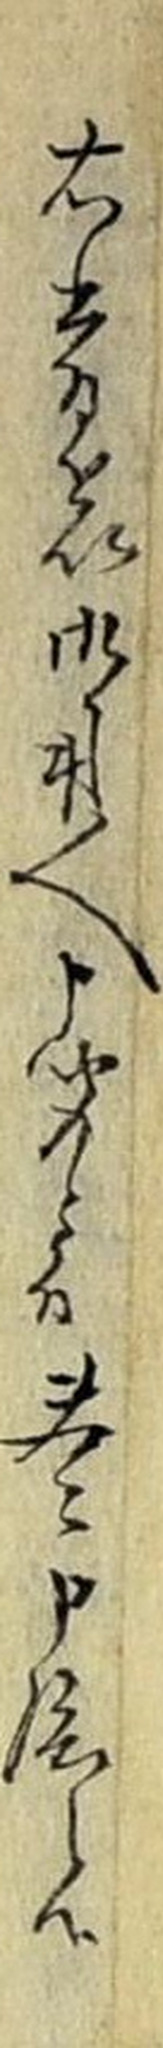右書付を以御用人申聞候に付夫々申渡之候
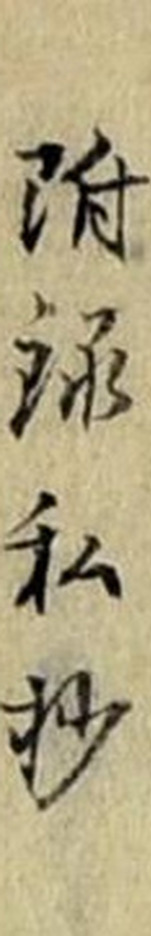附録私抄
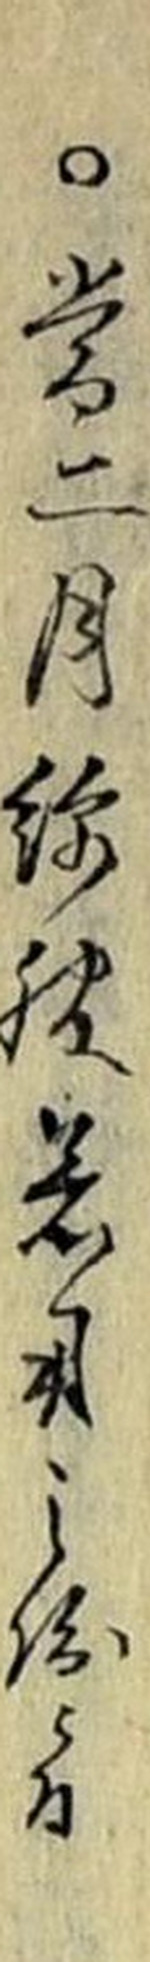○当二月綿服着用之儀に付
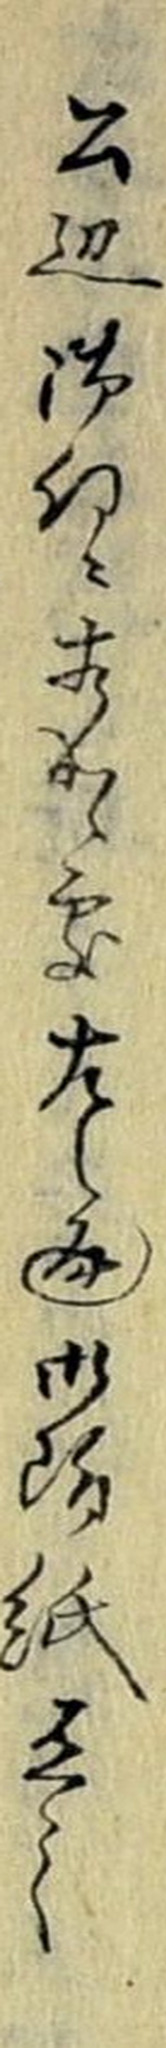公辺御伺に相成候処左之通御附紙有之
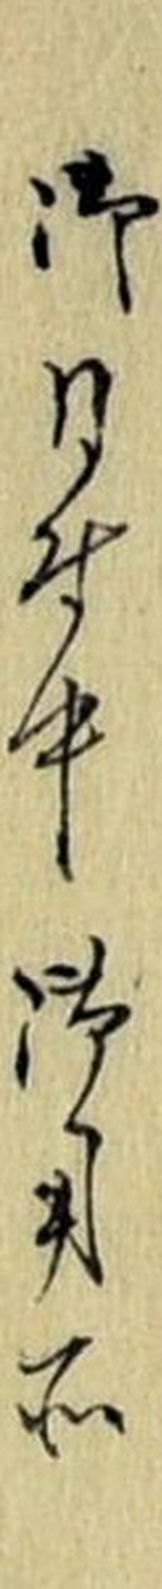御目付中御用所
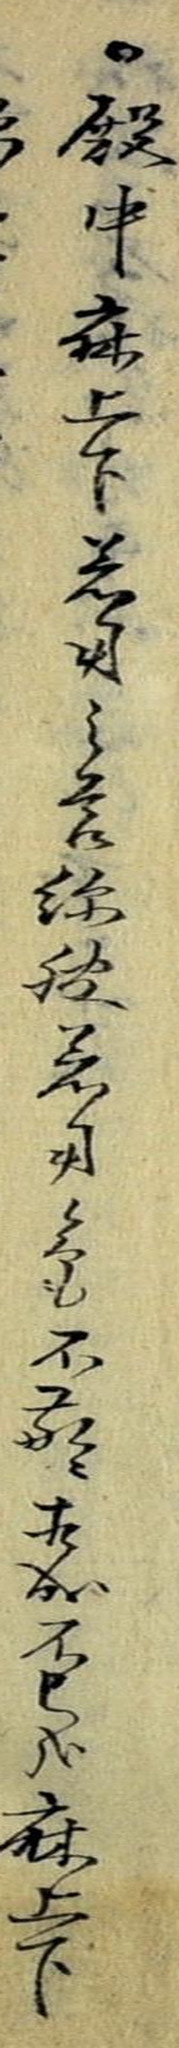○殿中麻上下着用之節綿服着用に而も不敬に相成不申候哉麻上下
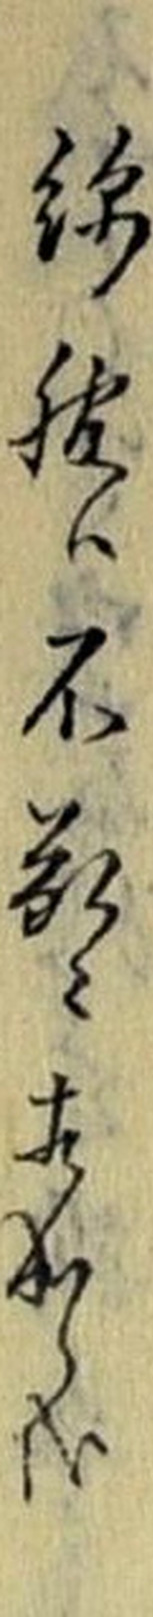綿服は不敬に相成候哉
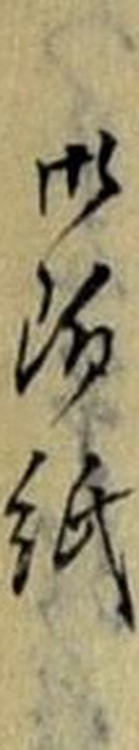御附紙
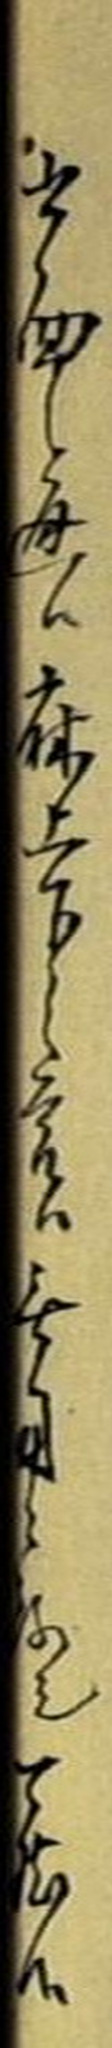書面之通候麻上下之節は無用に致し可然候
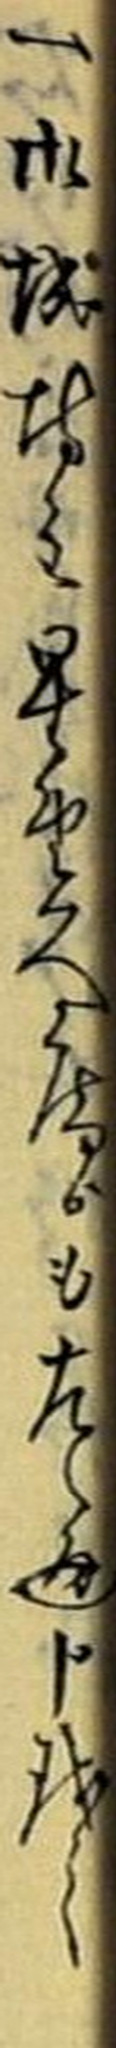一御城坊主星野久麿ゟも左之通申越之
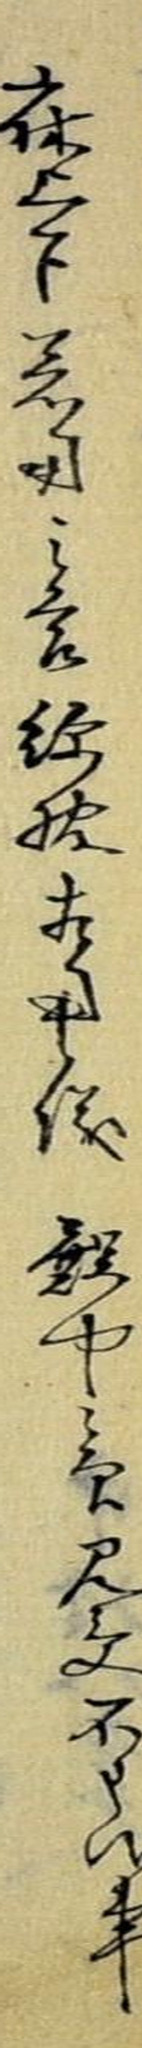麻上下着用之節綿服相用候儀殿中に而は見受不申候事
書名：命令之部 六
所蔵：福井県文書館 Fukui Prefectural Archives
